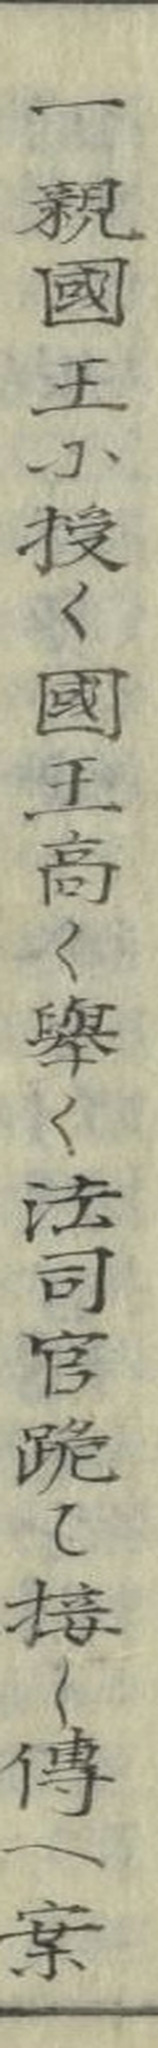一親国王に授く国王高く挙く法司官跪て接し伝へ案
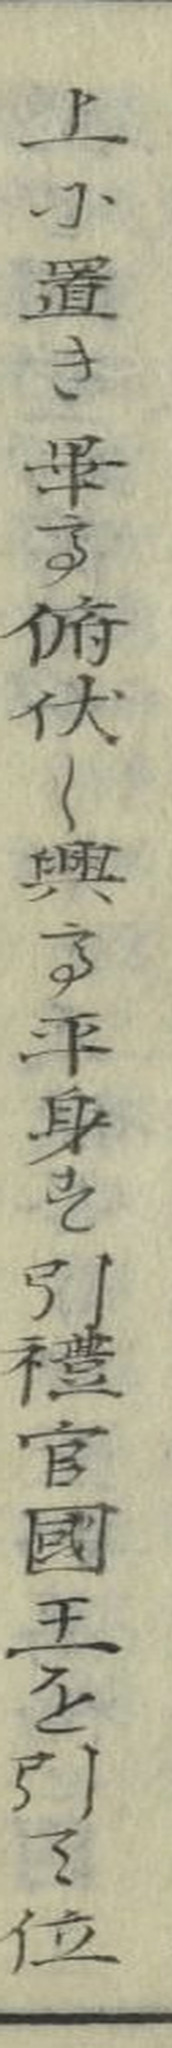上に置き畢て俯伏し興て平身す引礼官国王を引て位
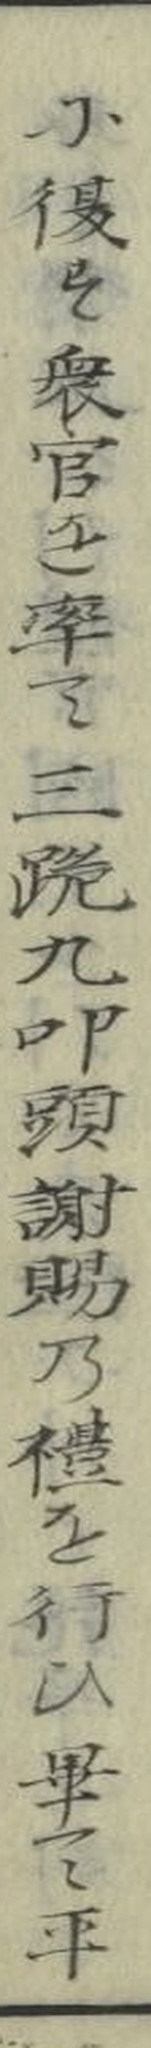に復す衆官を率て三跪九叩頭謝賜の礼を行ひ畢て平

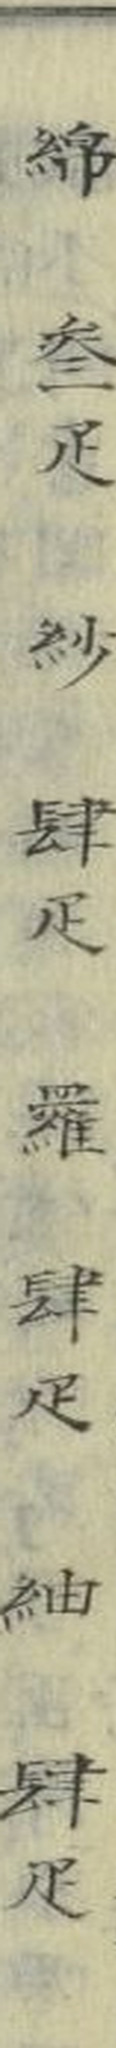綿参疋紗肆疋羅肆疋紬肆疋
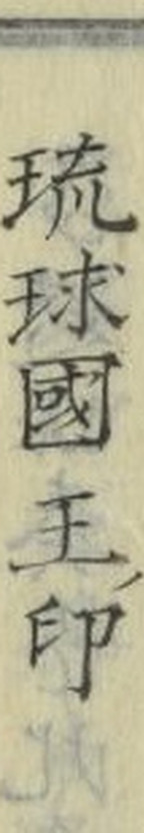琉球国王印
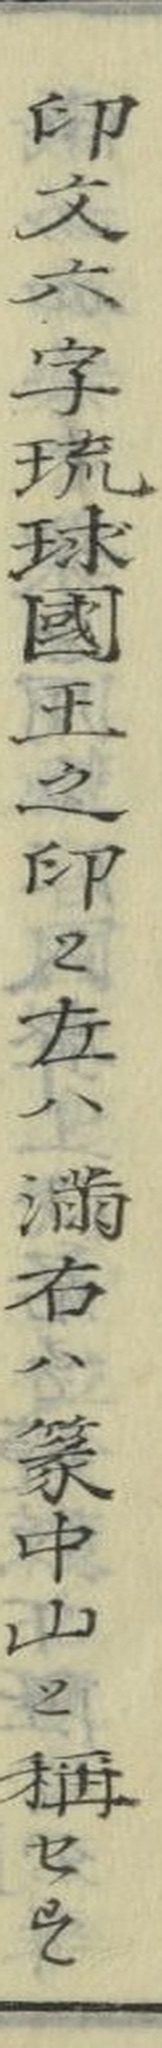印文六字琉球国王之印と左は満右は篆中山と称せす
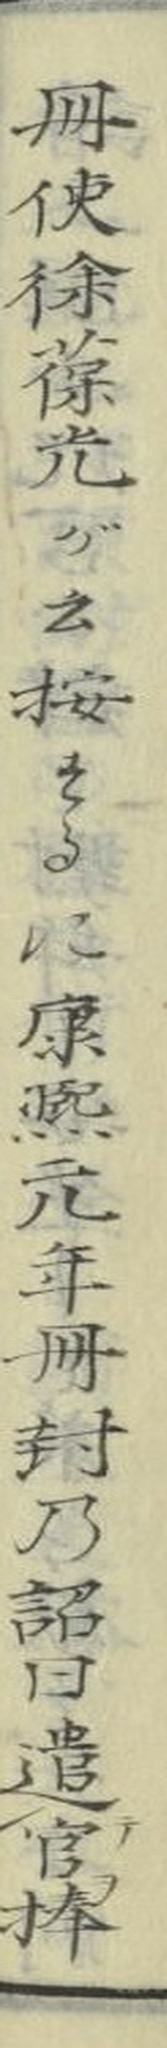冊使徐葆光が云按するに康煕元年冊封の詔曰遣官捧
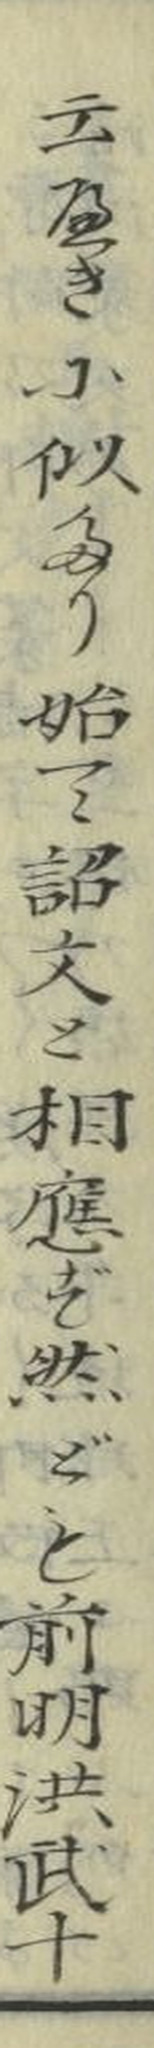云へきに似たり始て詔文と相応ず然ども前明洪武十
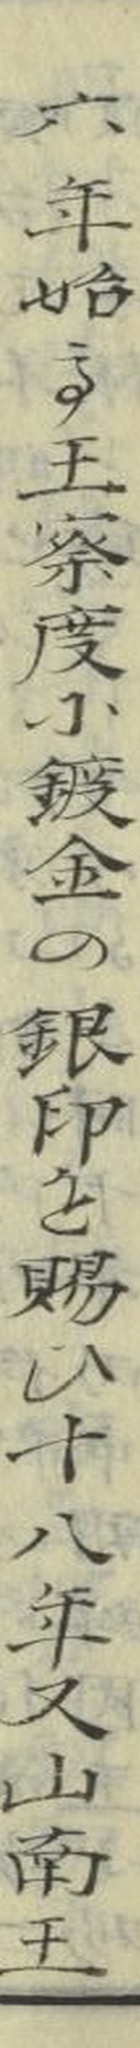六年始て王察度に鍍金の銀印を賜ひ十八年又山南王
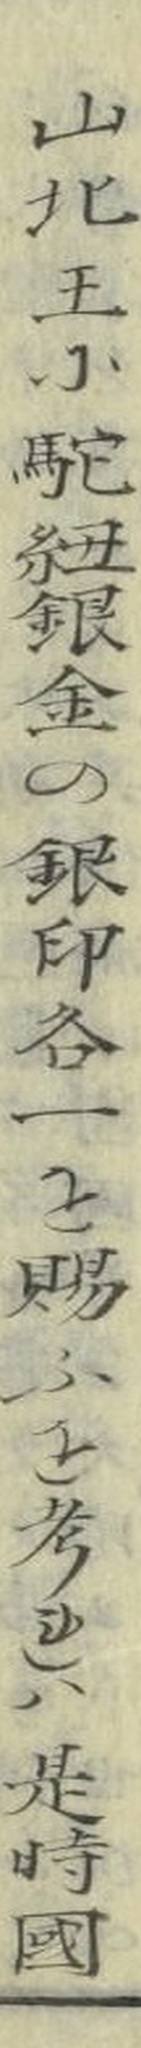山北王に駝紐銀金の銀印各一を賜ふを考れは是時国
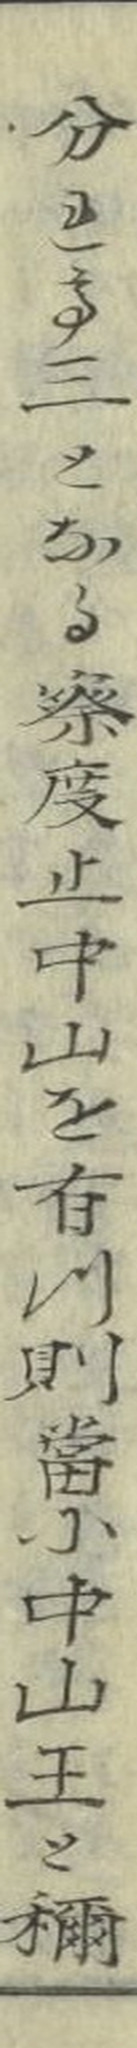分れて三となる察度止中山を有つ則当に中山王と称
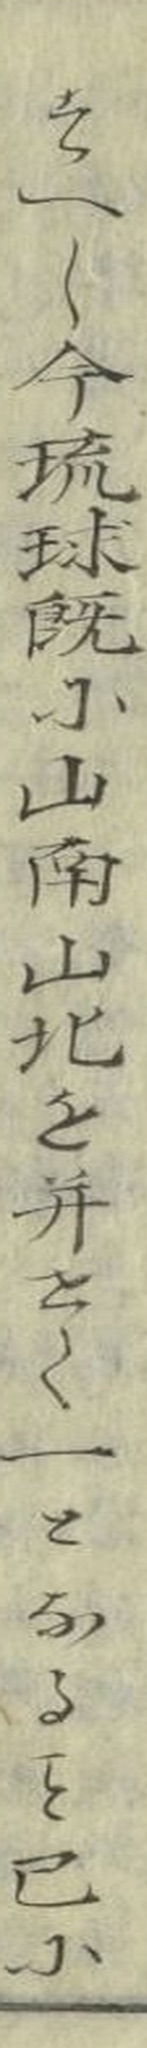すへし今琉球既に山南山北を并せて一となること已に
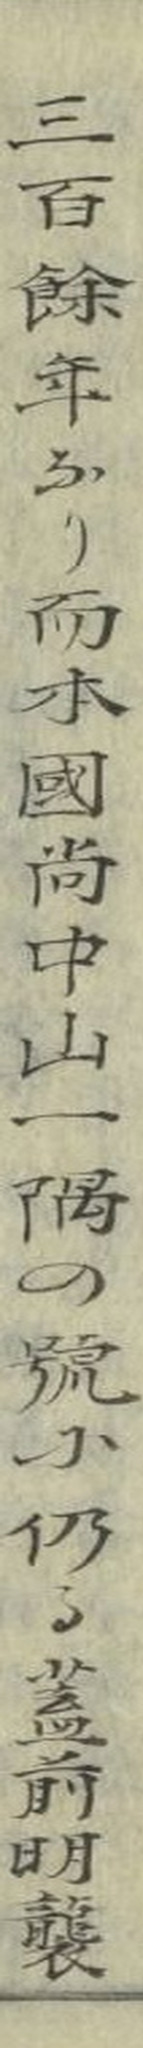三百餘年なり而本国尚中山一隅の號に仍る蓋前明襲
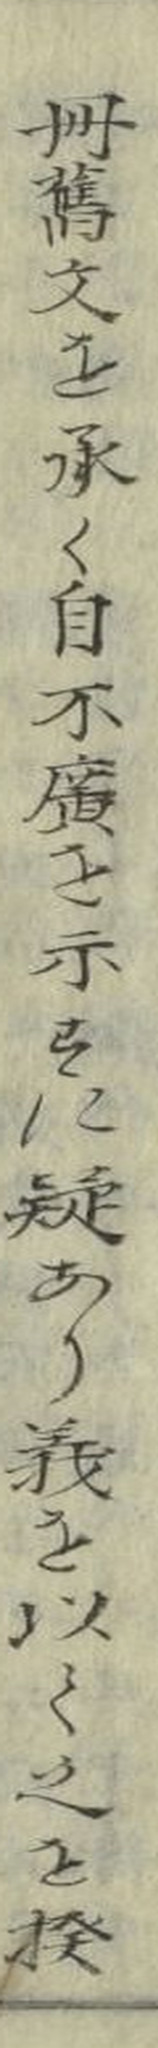冊旧文を承く自不広を示すに疑あり義を以て之を揆
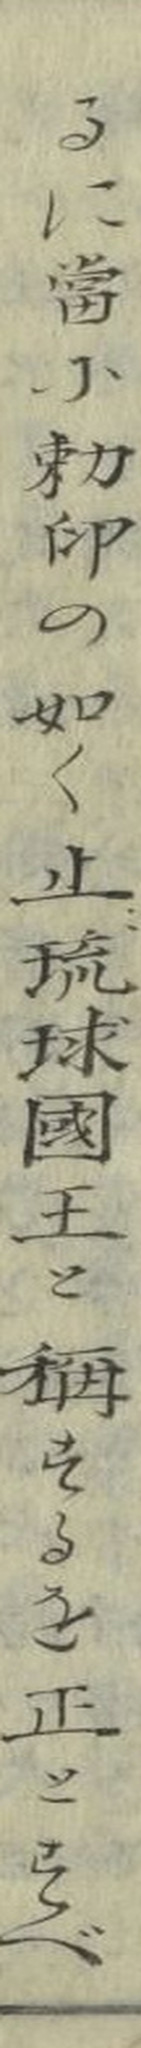るに当に勅印の如く止琉球国王と称するを正とすべ

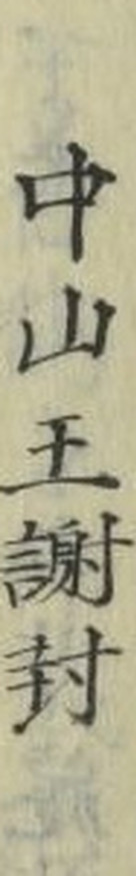中山王謝封
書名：琉球沿革志 下
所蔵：University of the Ryukyus Library
